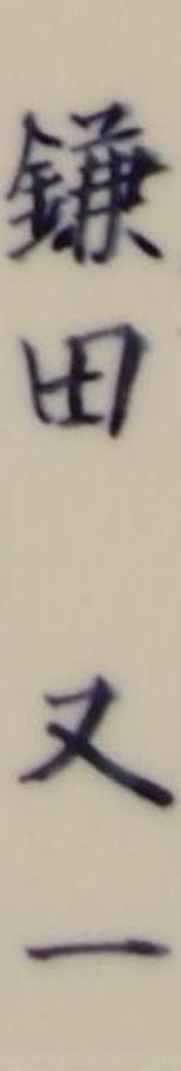鎌田又一
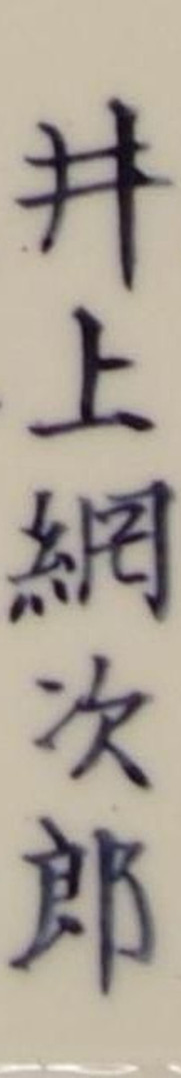井上綱次郎
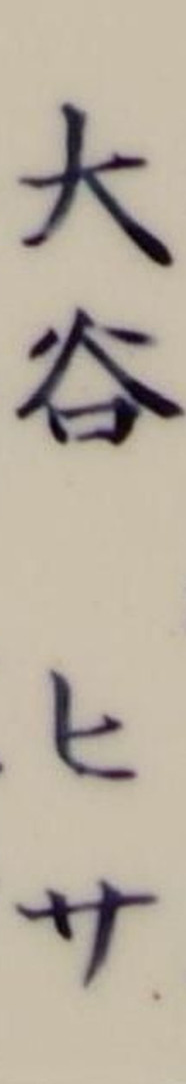大谷ヒサ
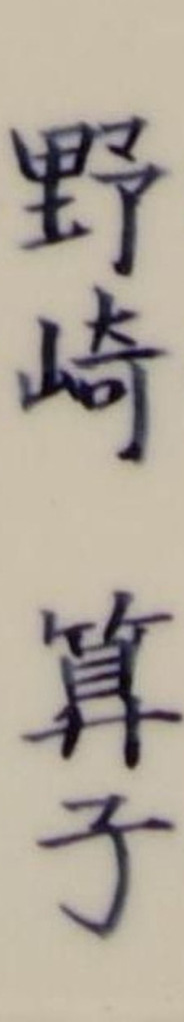野崎算子
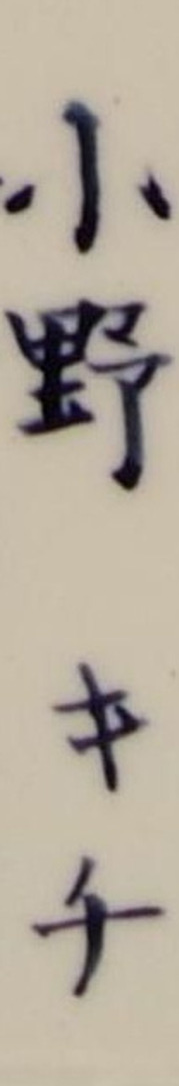小野キチ
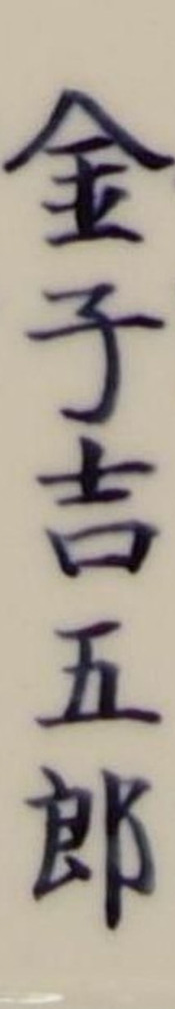金子吉五郎
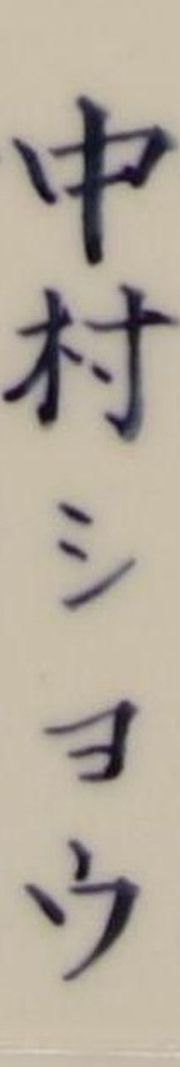中村シヨウ
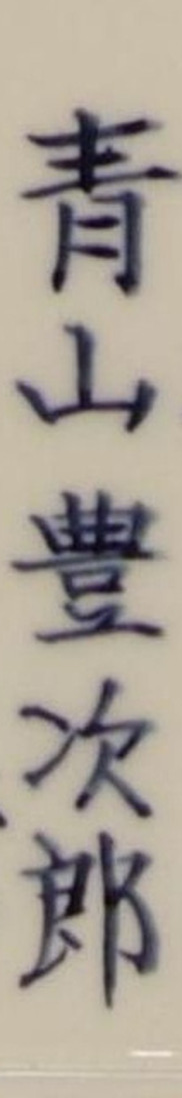青山豊次郎
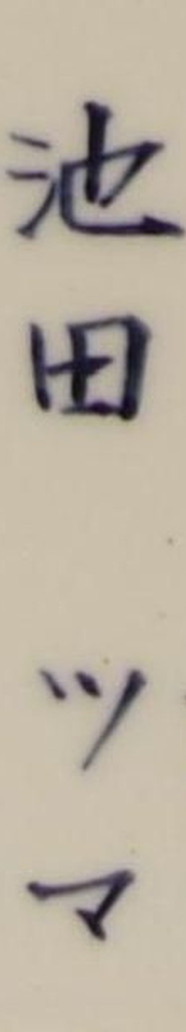池田ツマ
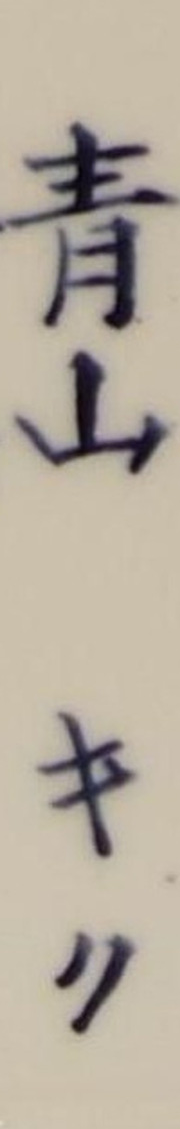青山キク
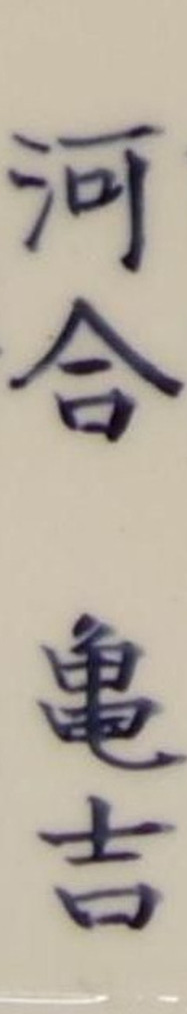河合亀吉
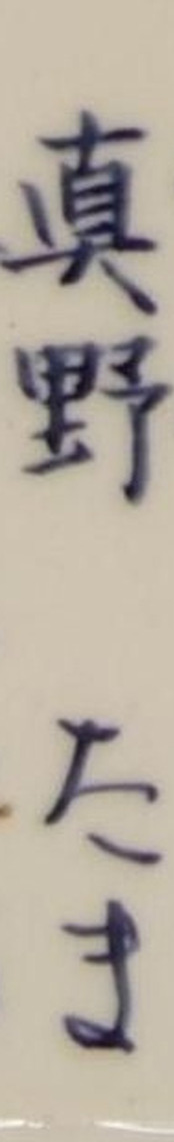真野たま
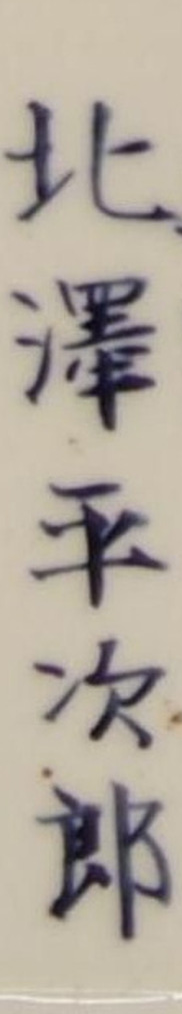北澤平次郎

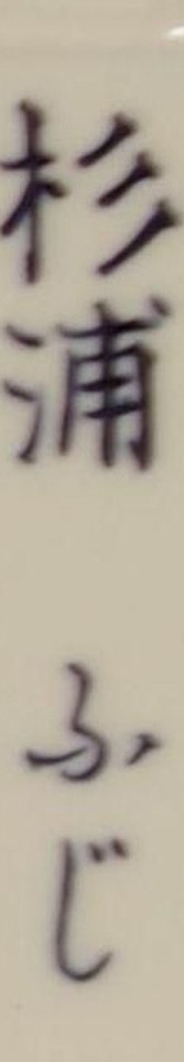杉浦ふじ
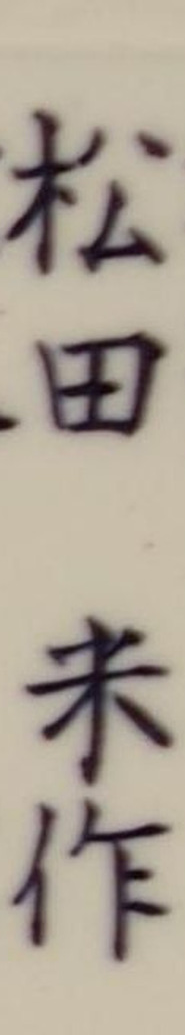松田米作
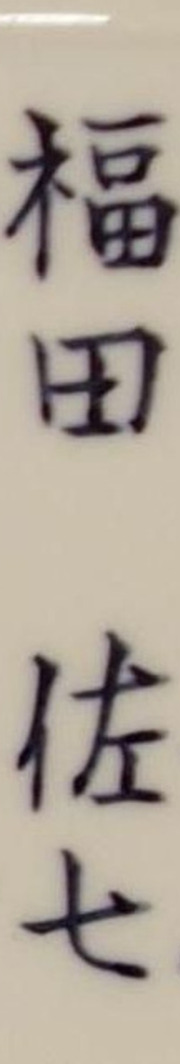福田佐七
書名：M~S
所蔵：高野山金剛峯寺
